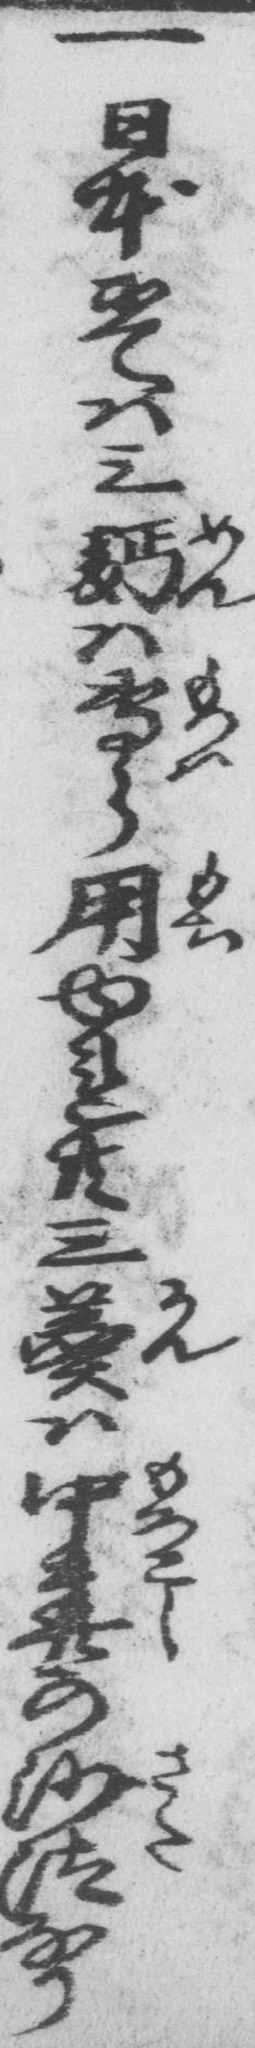一日本にてハ麪ハ用ゆれ三羹は中華の沙汰なり
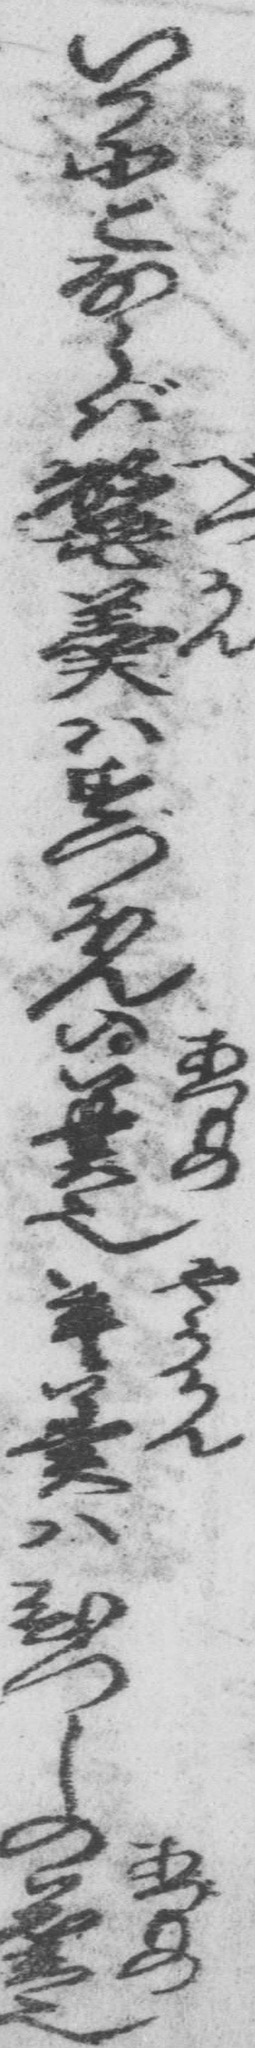いかにこならバ鼈羹ハすつほんハ羹也羊羹はひつしの羹也
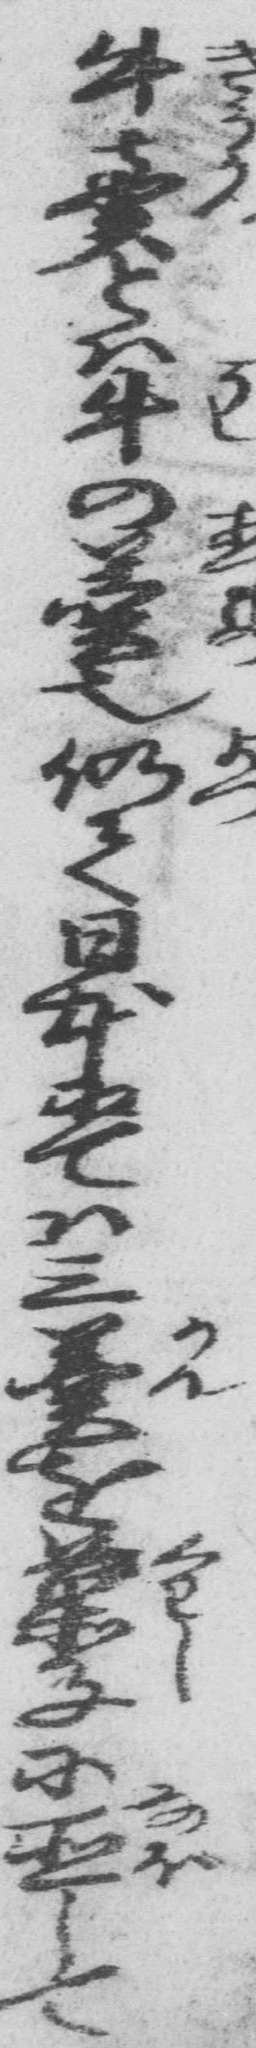牛羹とハ牛の羹也依て日本にて三羹を菓子に直して
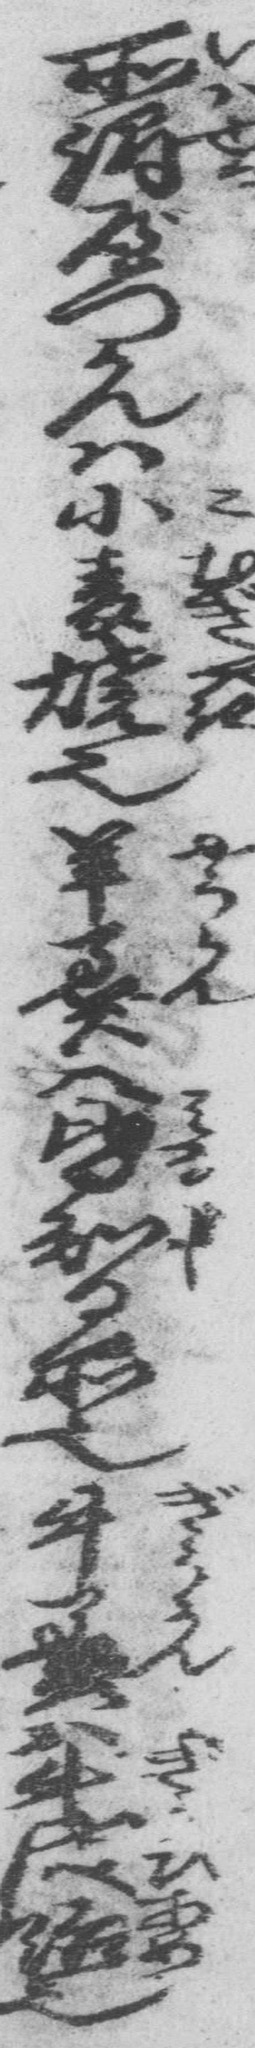所謂べつかんハ小麦焼也羊羹へる所牛羹ハ牛皮飴也
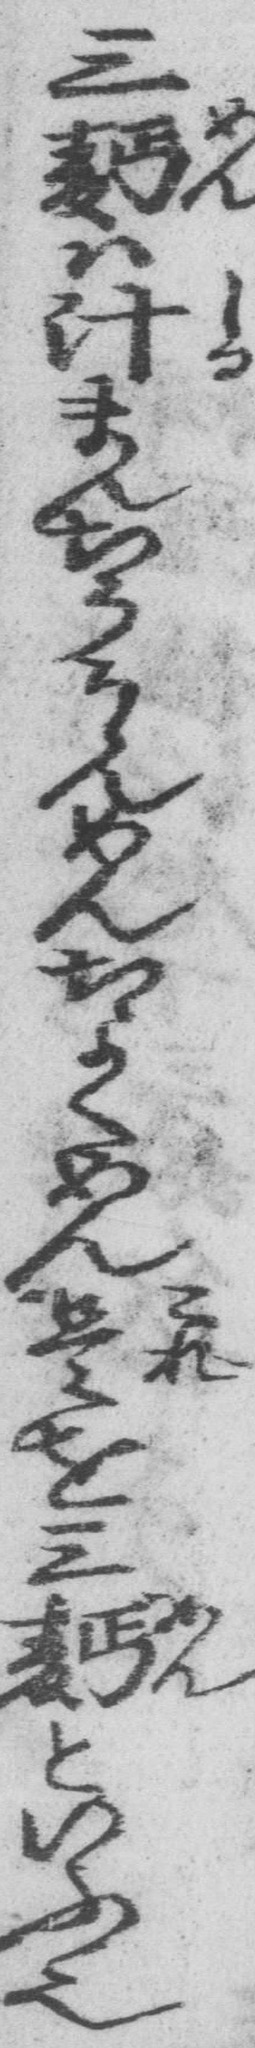三麪は汁まんちううんめんちょくめん是を三麪といふ也
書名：当世料理献立
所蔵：大阪府立大学学術情報センター 国文学研究資料館
